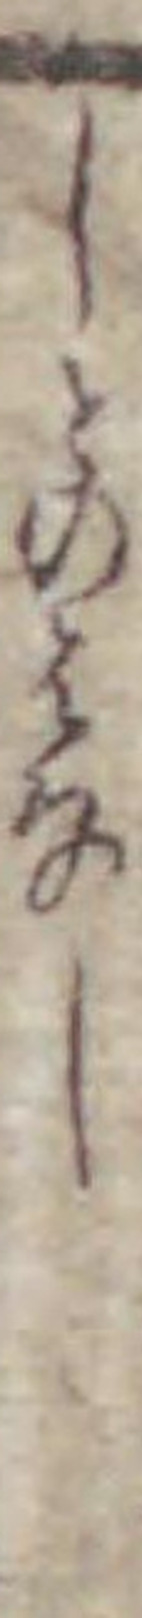しとのはなし
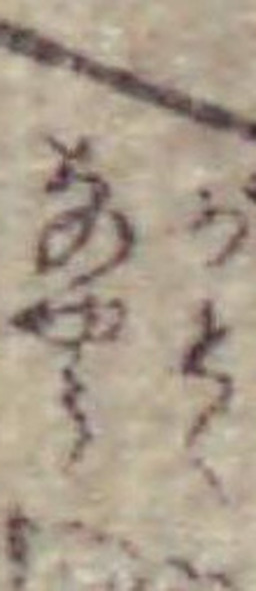なやう
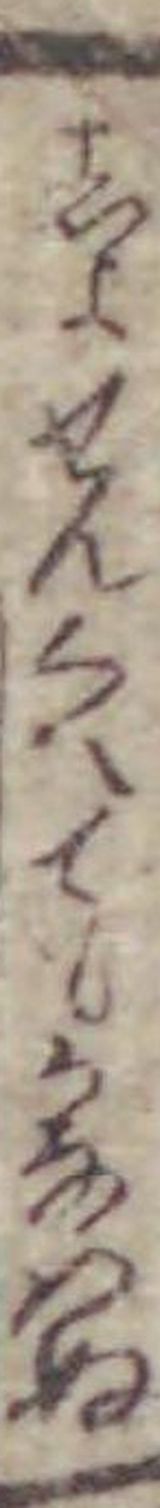しよせんくいてもかなはぬ
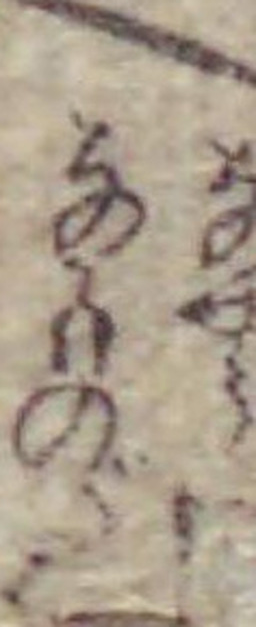なものだ
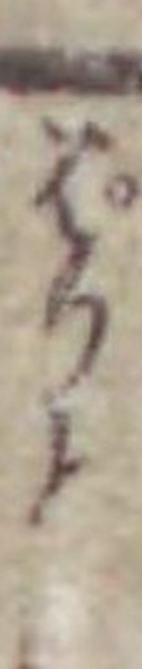ぱりと
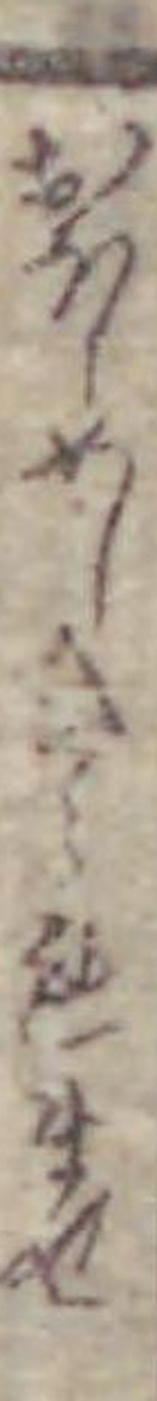おほしめしきられませ
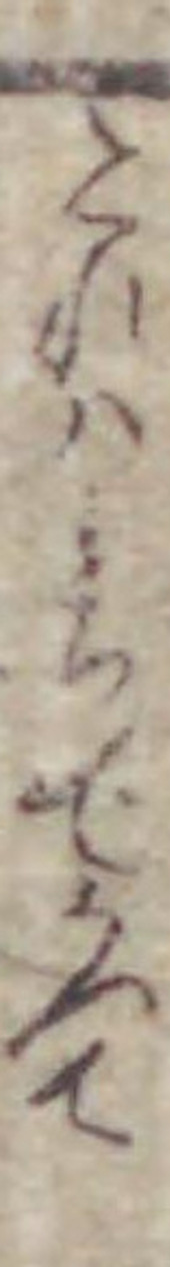これはこちでかつて
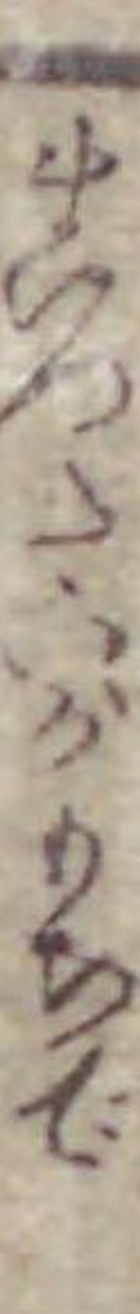まいつたいがもちで
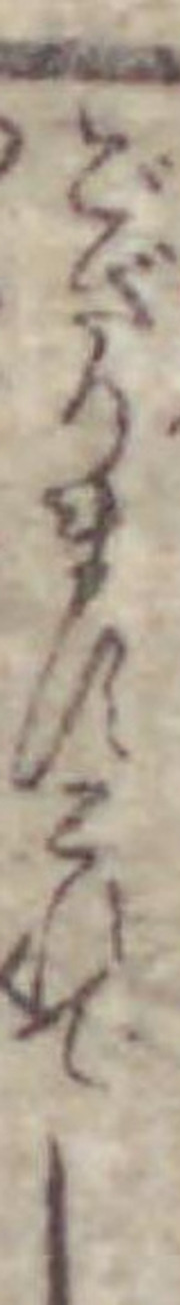ござりますこれで
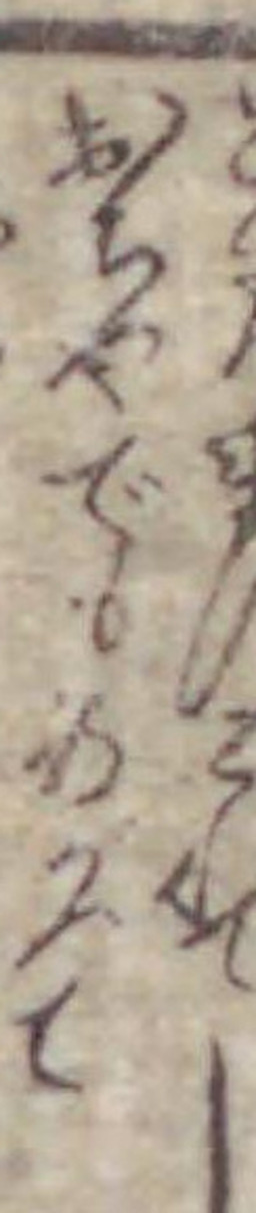おちやでもあがつて
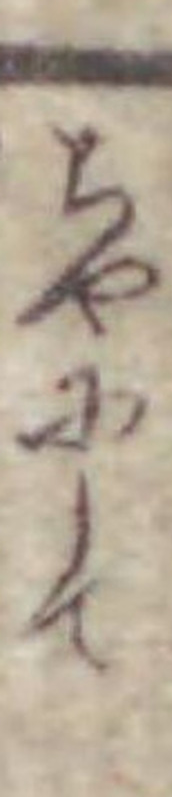ちやにして
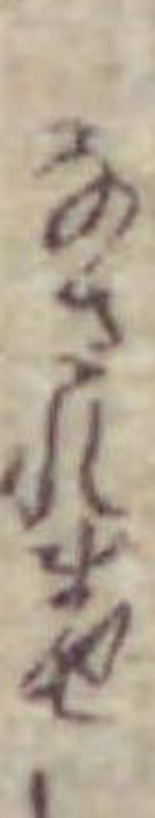なされませ
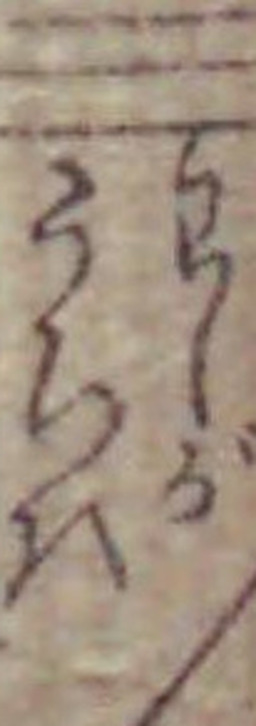うちは
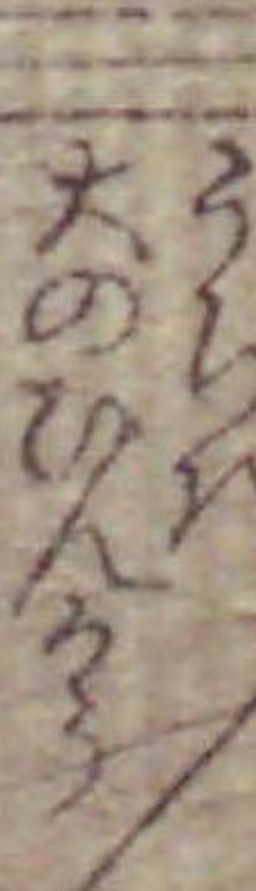大のひんろう
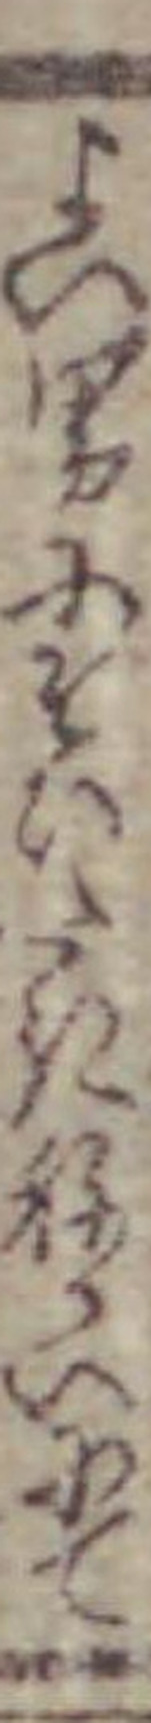よい男にそいたきねかいにて
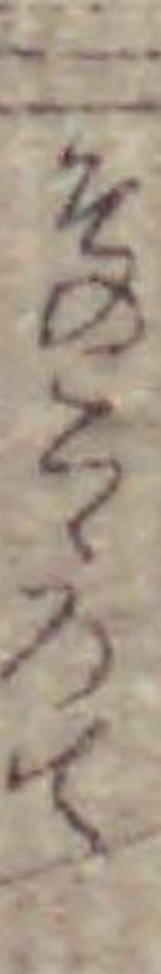そのこゝろて
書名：嗚呼不侭世之助噺 : 3巻
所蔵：国立国会図書館 National Diet Library, JAPAN
